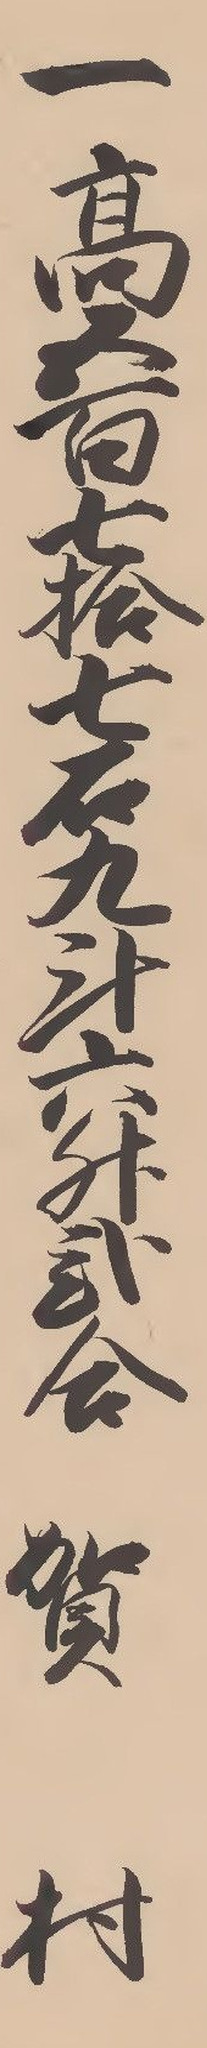一高五百七拾七石九斗六升弐合賀村
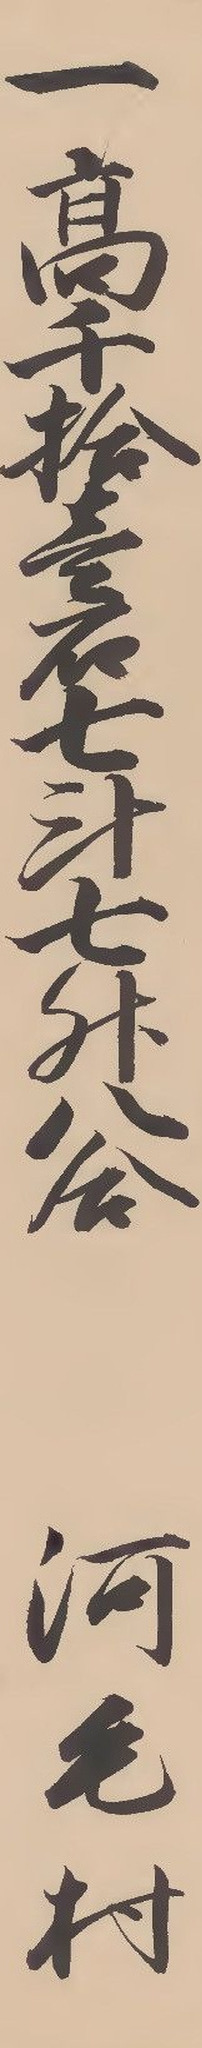一高千拾壱石七斗七升八合河毛村
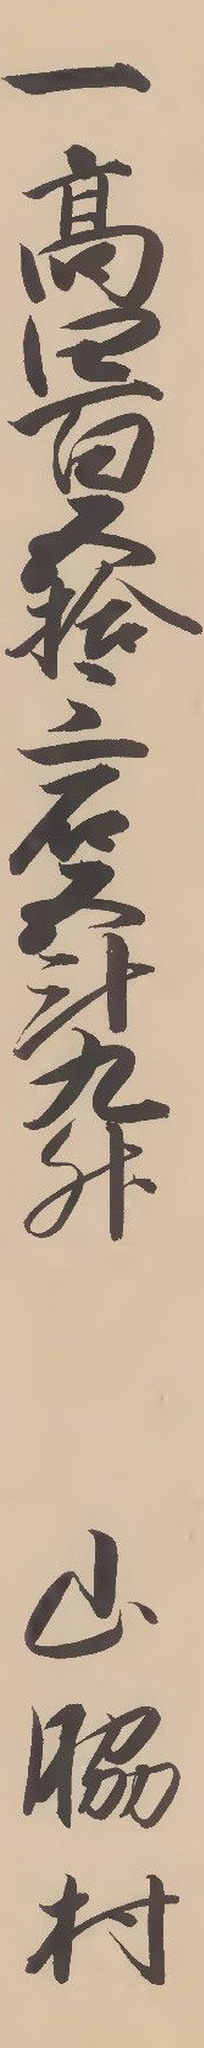一高四百五拾三石五斗九升山脇村
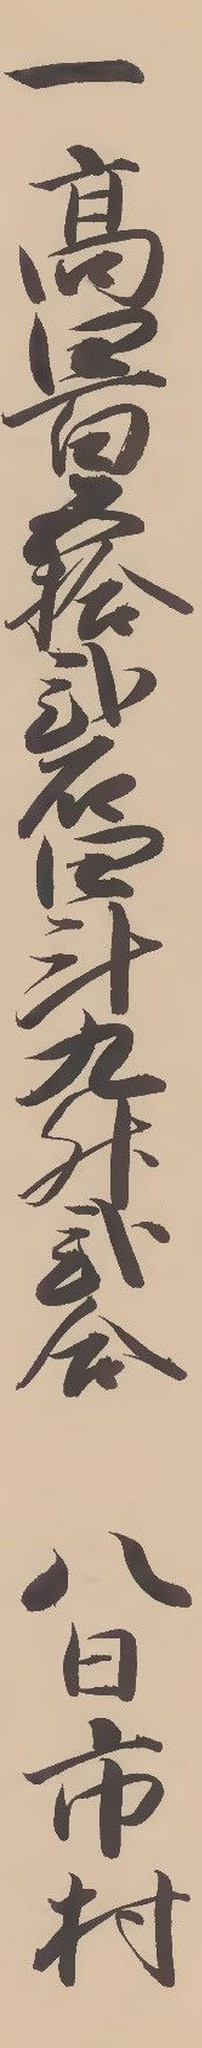一高四百五拾弐石四斗九升弐合八日市村
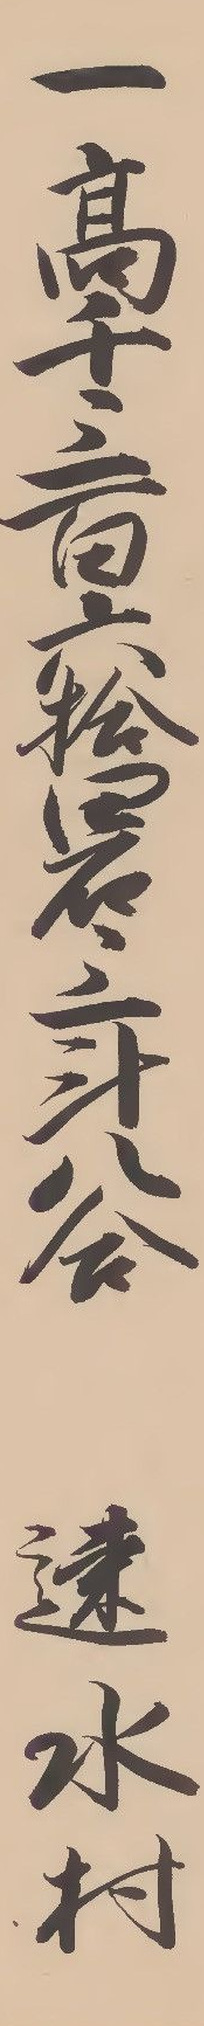一高千三百六拾四石三斗八合速水村

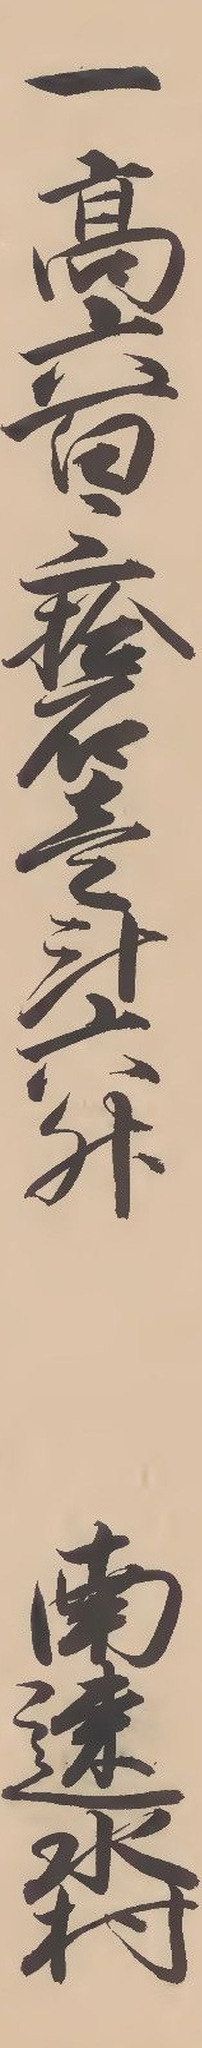一高六百三拾石壱斗六升南速水村
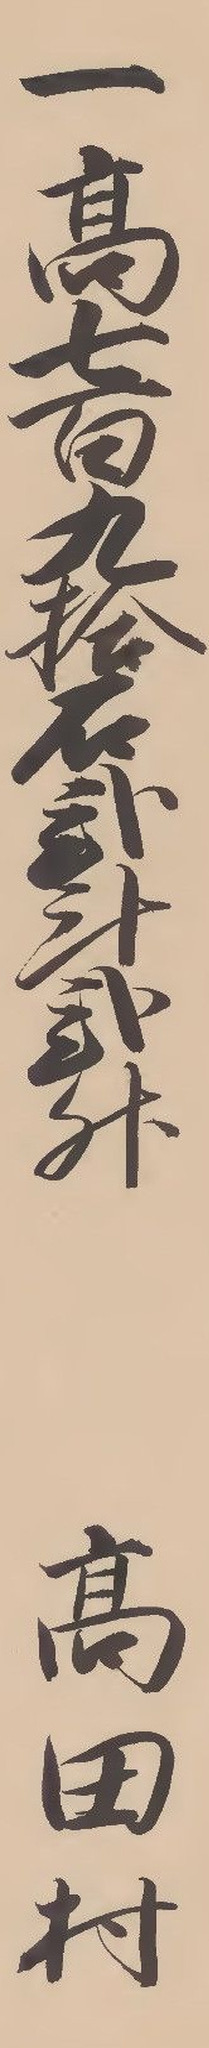一高七百九拾石弐斗弐升高田村
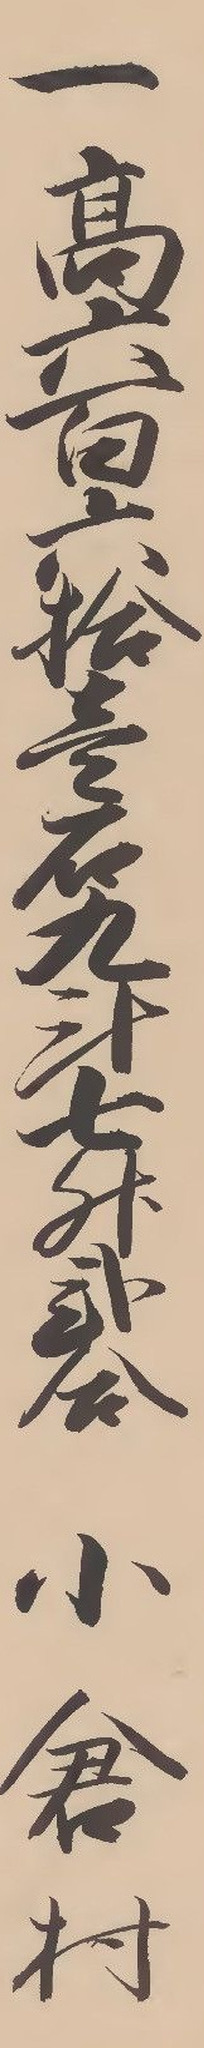一高六百六拾壱石九斗七升弐合小倉村
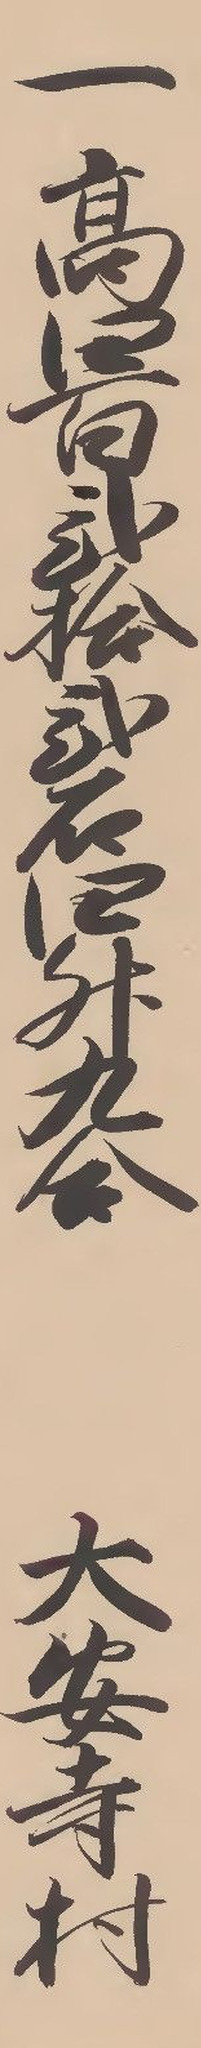一高四百弐拾弐石四升九合大安寺村
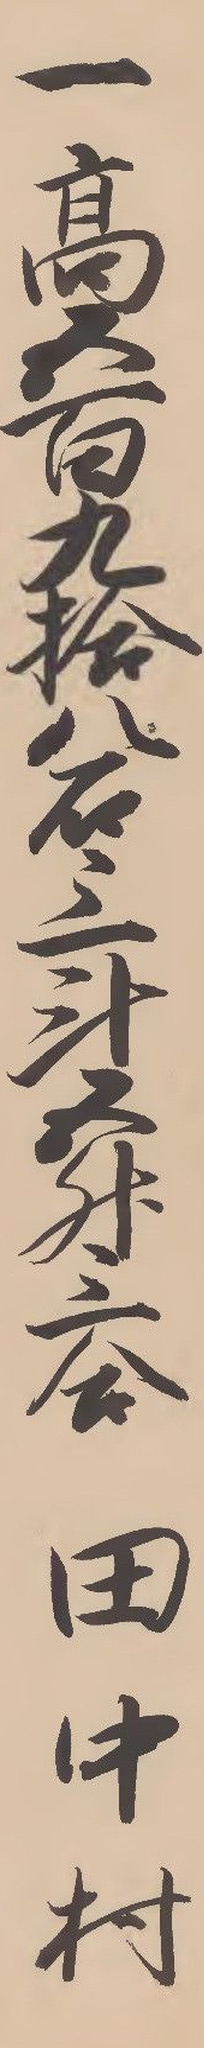一高五百九拾八石三斗五升三合田中村
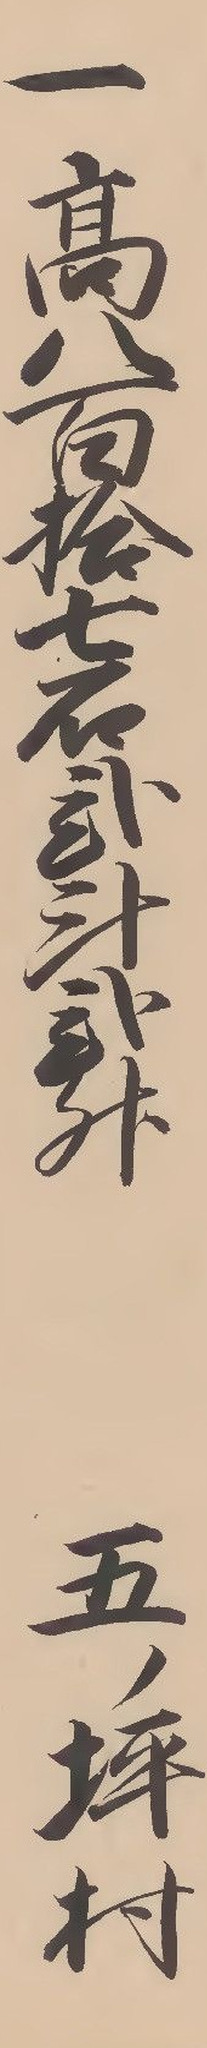一高八百拾七石弐斗弐升五ノ坪村
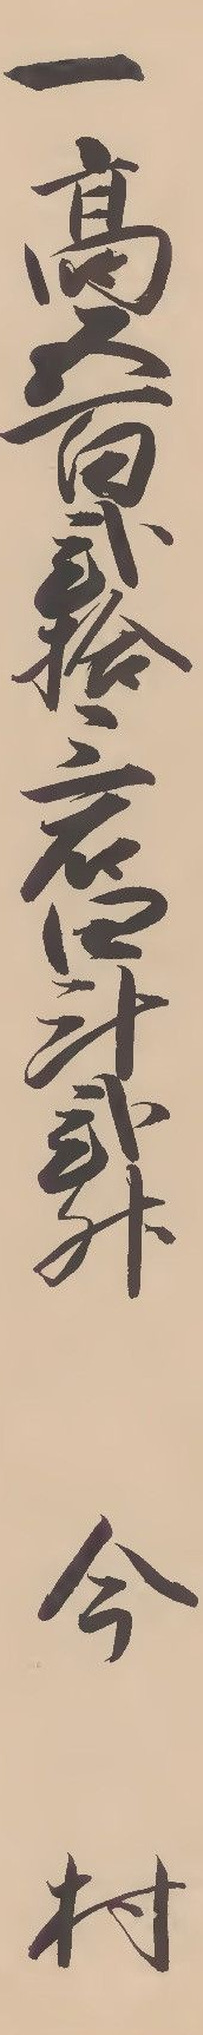一高五百弐拾三石四斗弐升今村
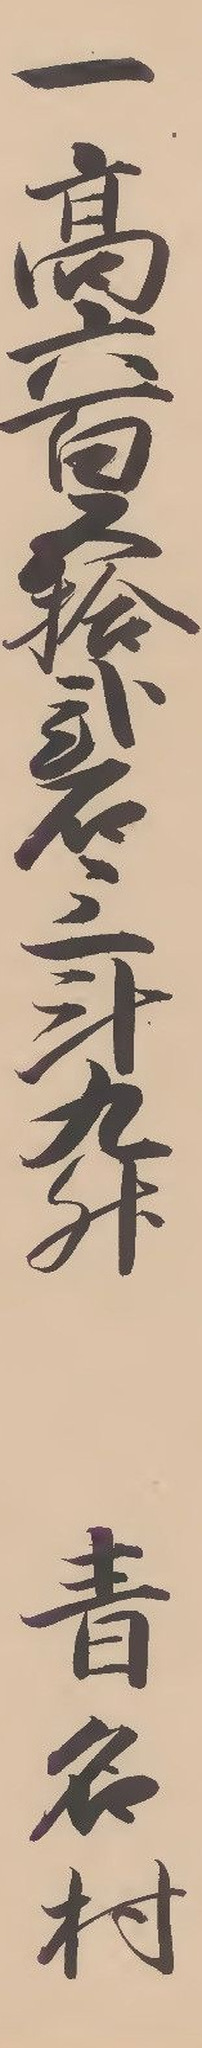一高六百五拾弐石三斗九升青名村

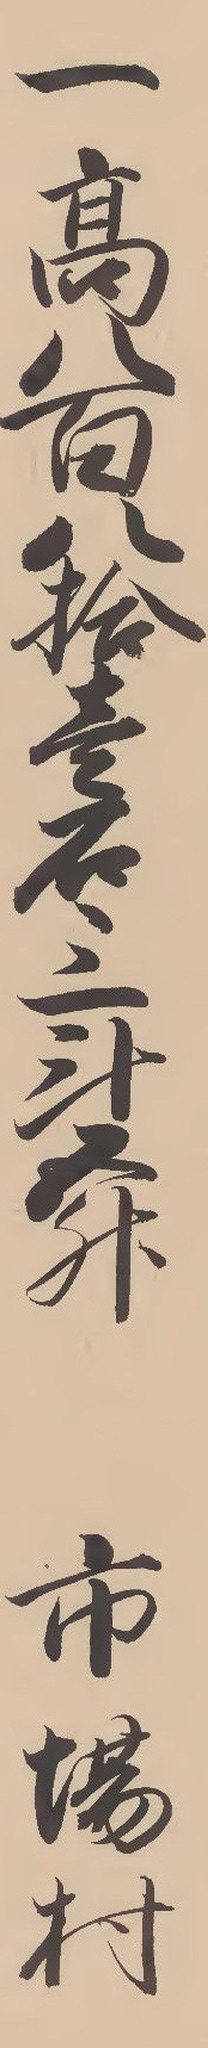一高八百八拾壱石三斗五升市場村
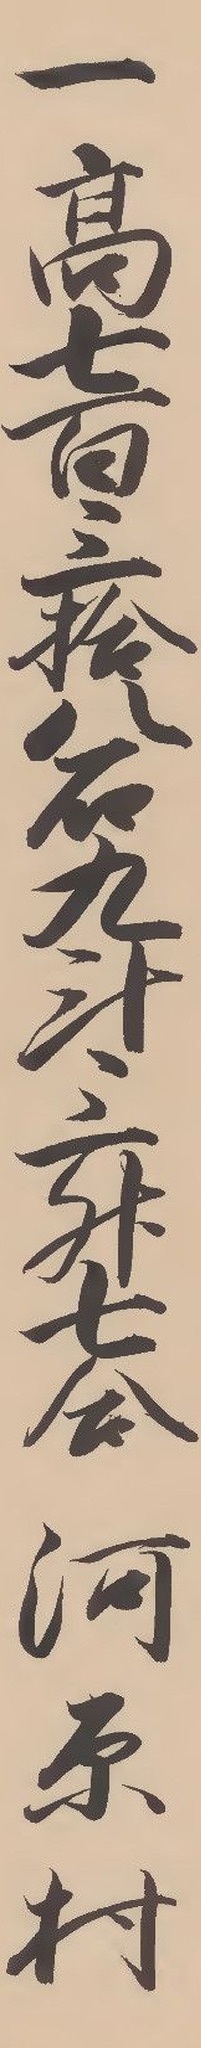一高七百三拾八石九斗三升七合河原村
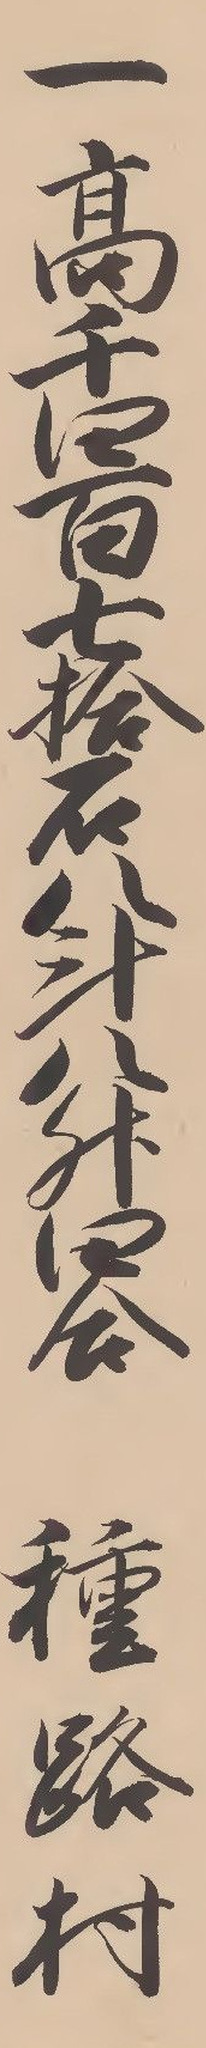一高千四百七拾石八斗八升四合種路村
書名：近江国郷帳
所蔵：国立公文書館 National Archives of Japan
